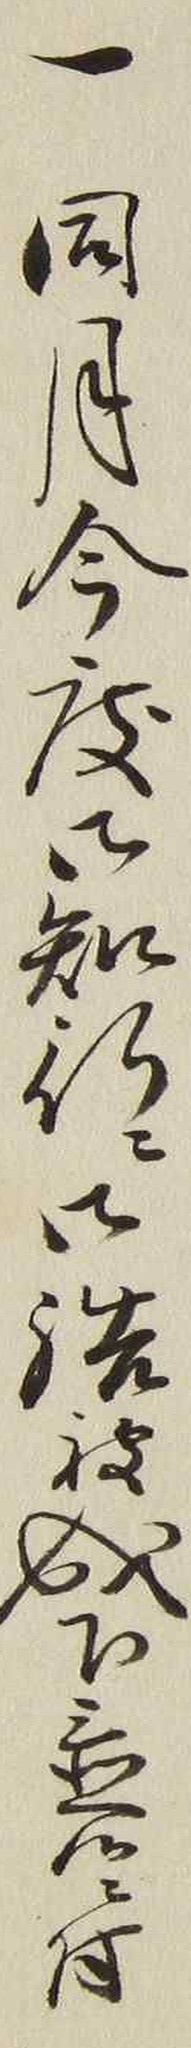一同月今度御知行ニ御詰被成下置候ニ付
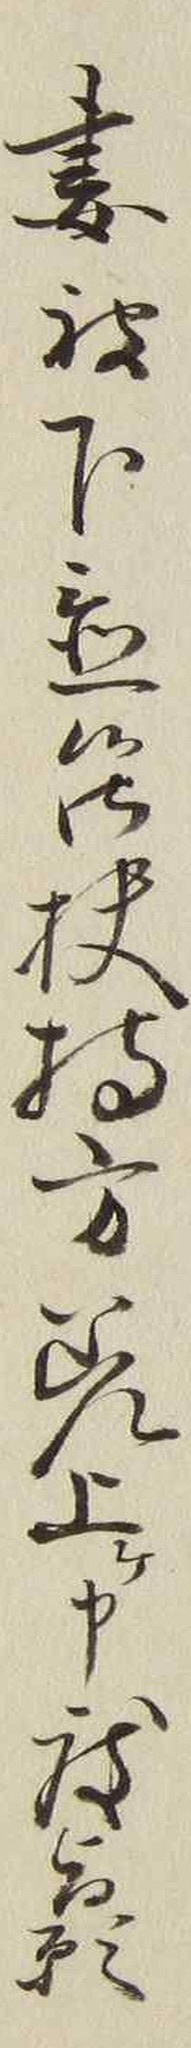妻被下置候御扶持方差上ヶ申度旨願

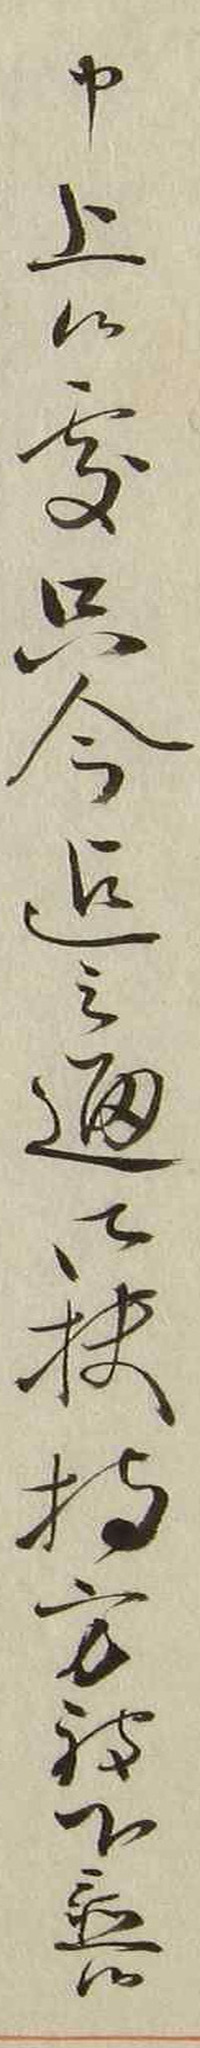申上候処只今迄之通御扶持方被下置候
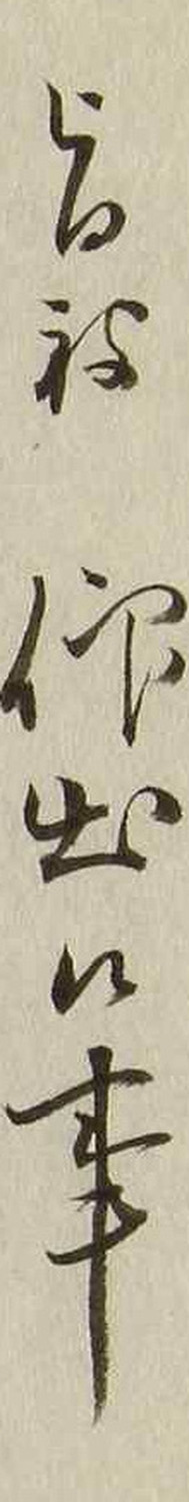旨被仰出候事
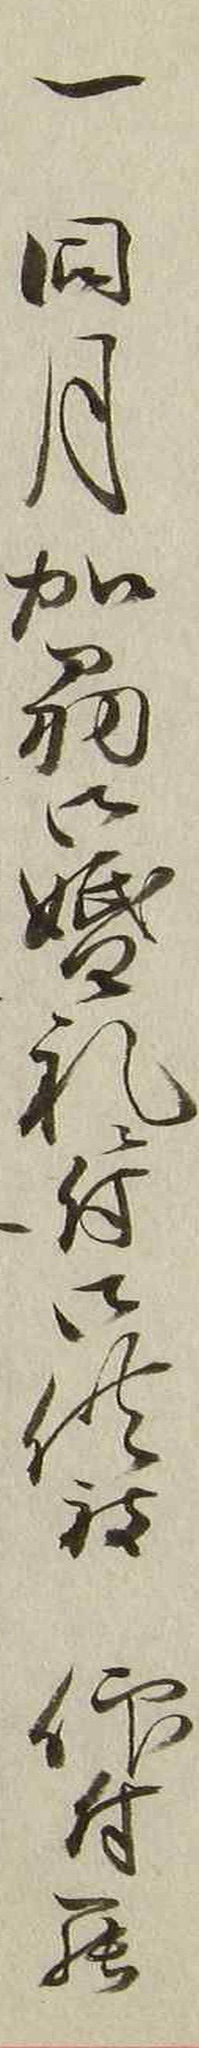一同月加州御婚礼ニ付御供被仰付罷
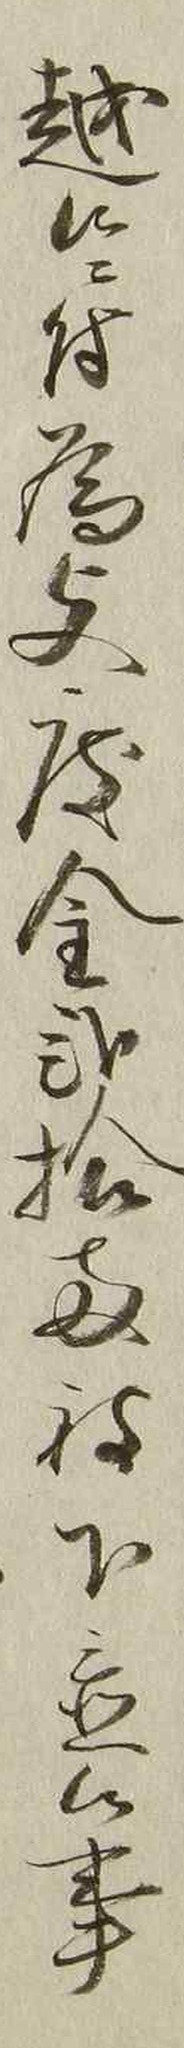越候ニ付為支度金弐拾両被下置候事
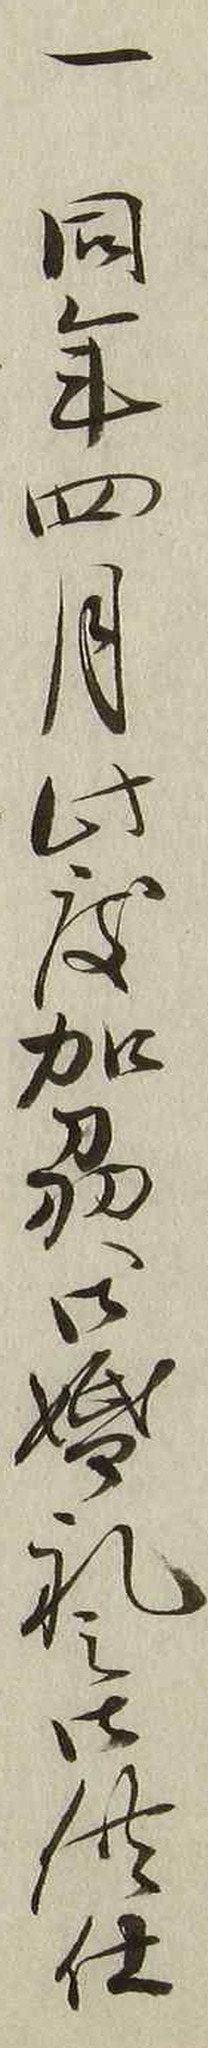一同年四月此度加州ㇸ御婚礼之御供仕
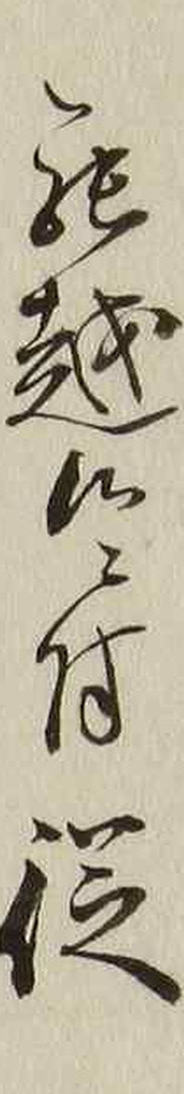罷越候ニ付従
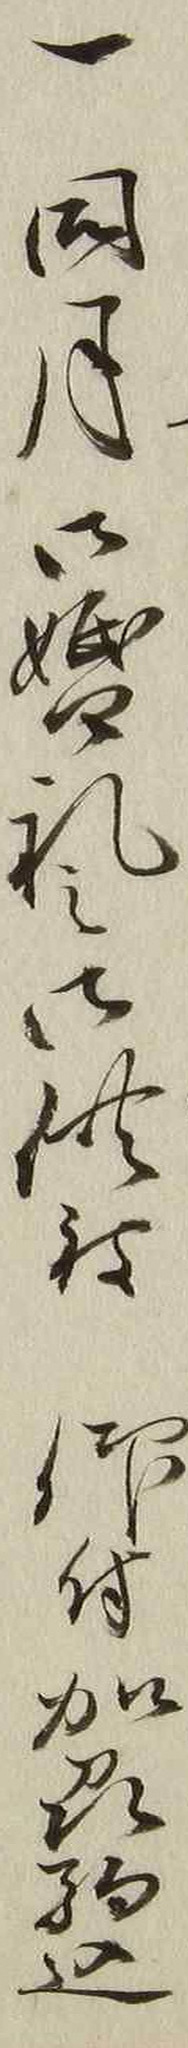一同月御婚礼之御供被仰付加州駒込
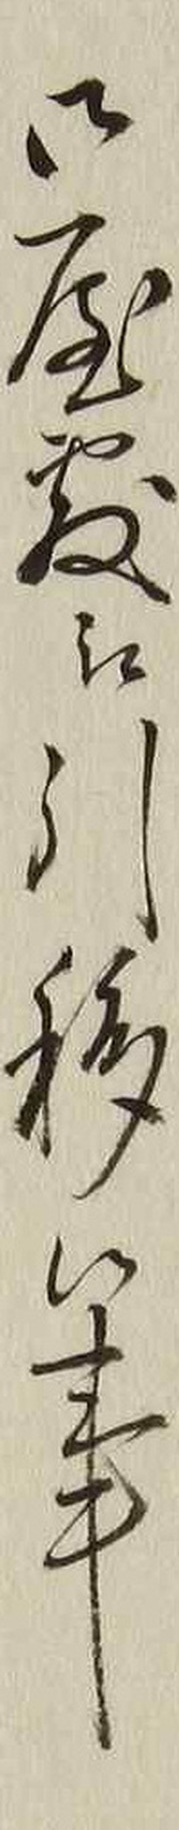御屋敷え引移候事
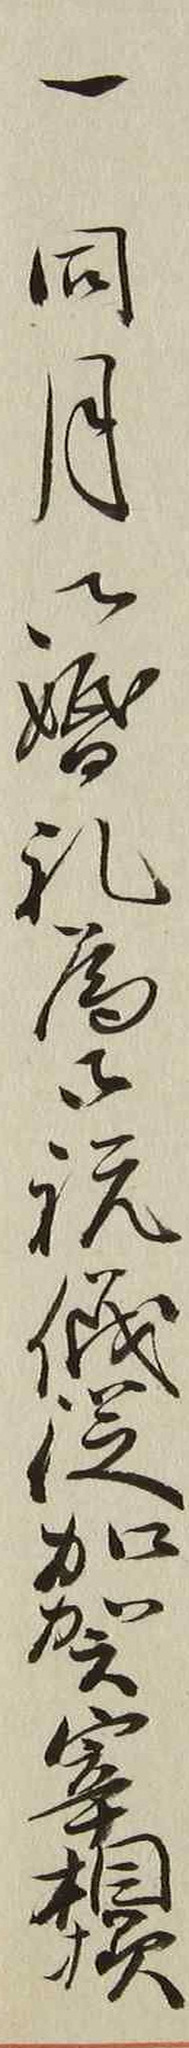一同月御婚礼為御祝儀従加賀宰相様
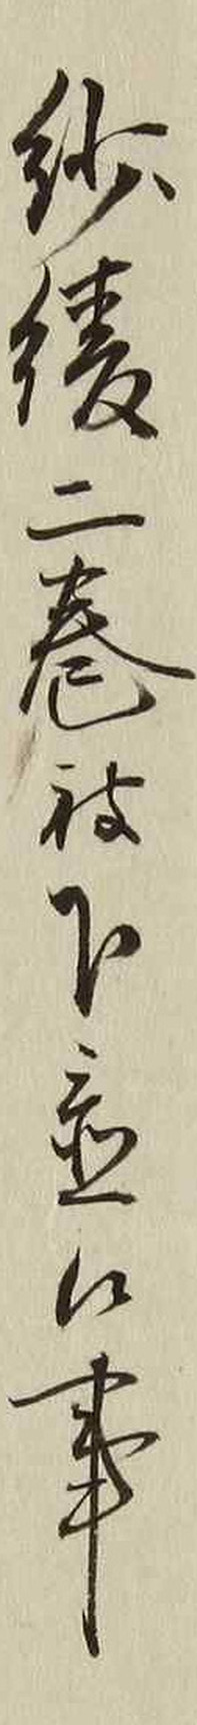紗綾二巻被下置候事
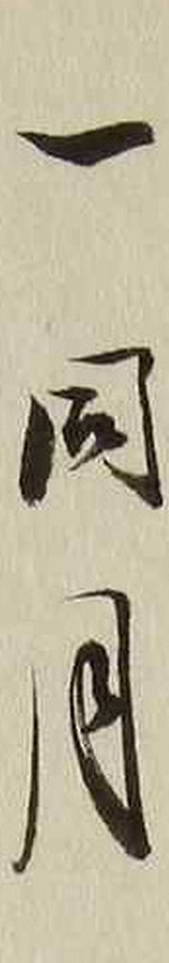一同月
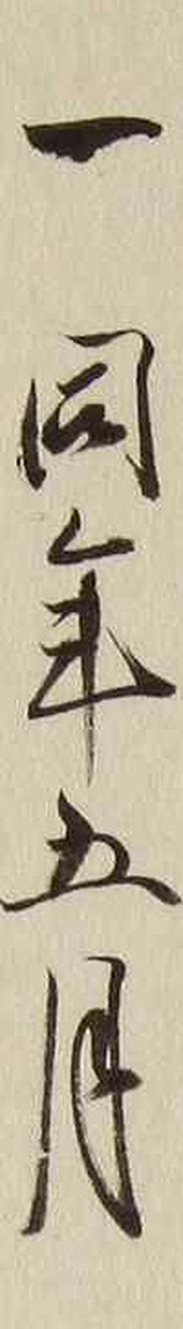一同年五月
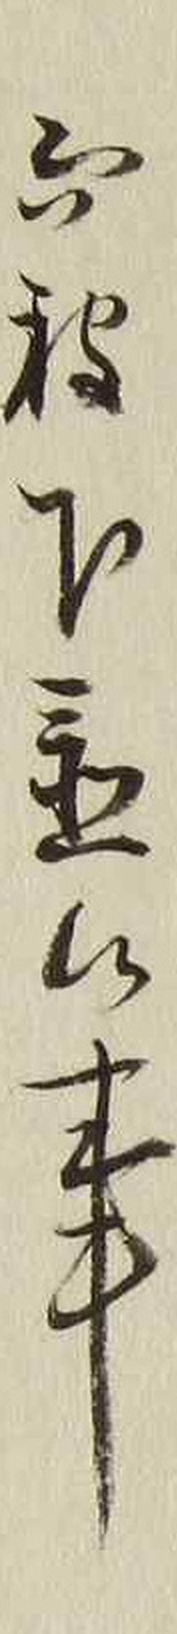而被下置候事
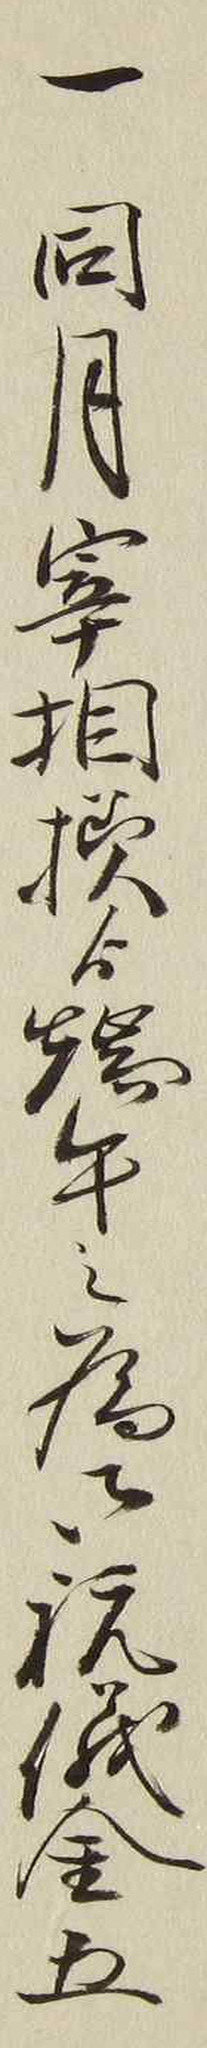一同月宰相様ゟ端午之為御祝儀金五
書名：諸士系譜　巻之163　な之部5
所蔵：会津若松市立会津図書館
